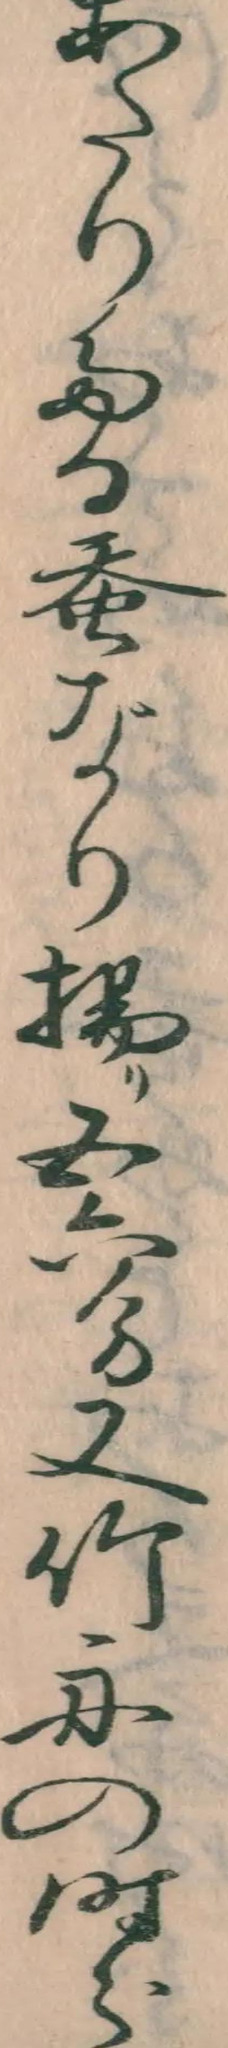あたりたる蚕なり揚り五六分又竹舟の時分
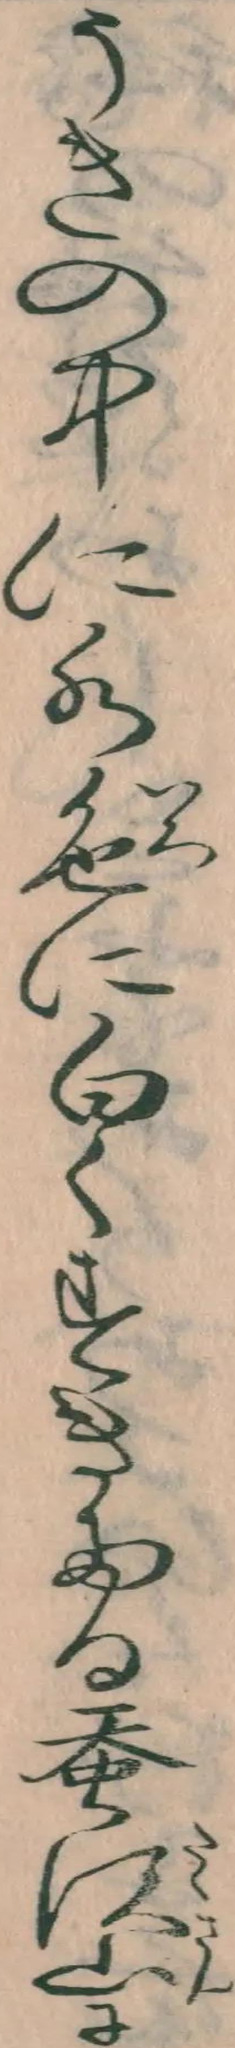うきの中に水色に白くすきたる蚕沢山に
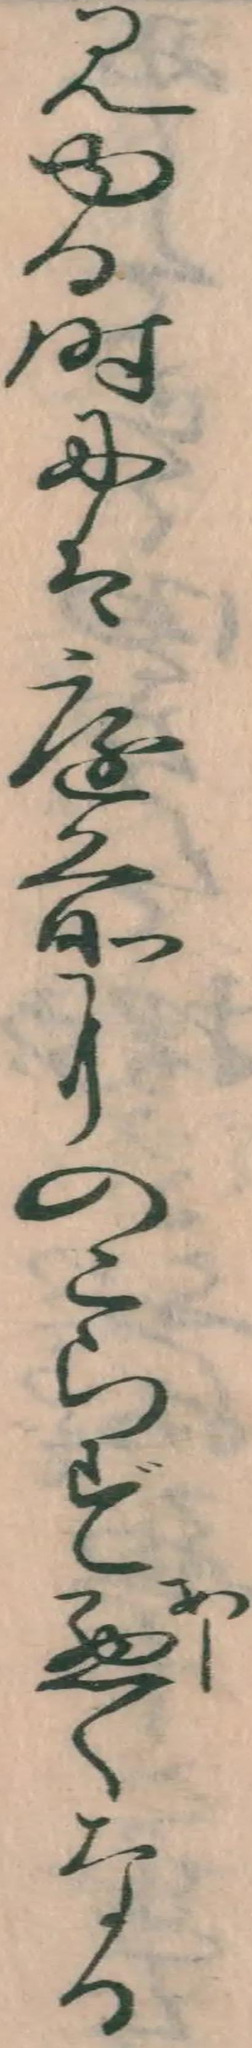見ゆる時には庭前にのこらず悪くなる
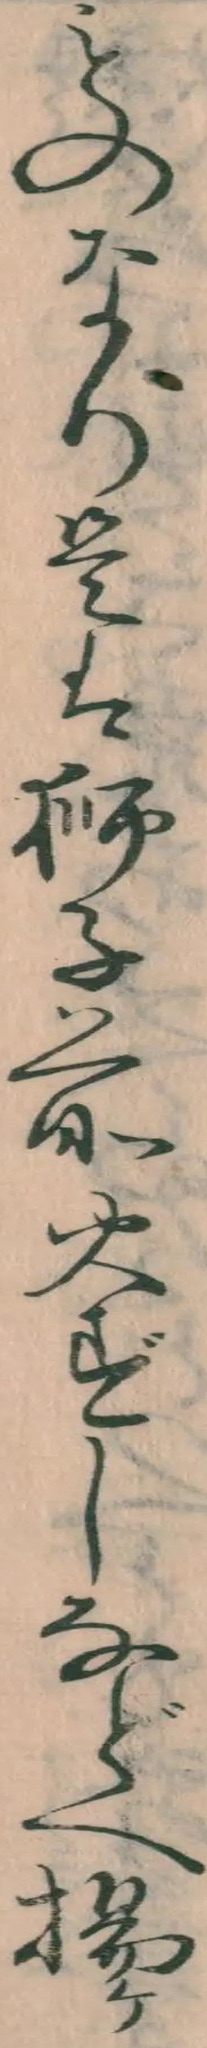ものなり是は獅子前火ずしなどへ揚け
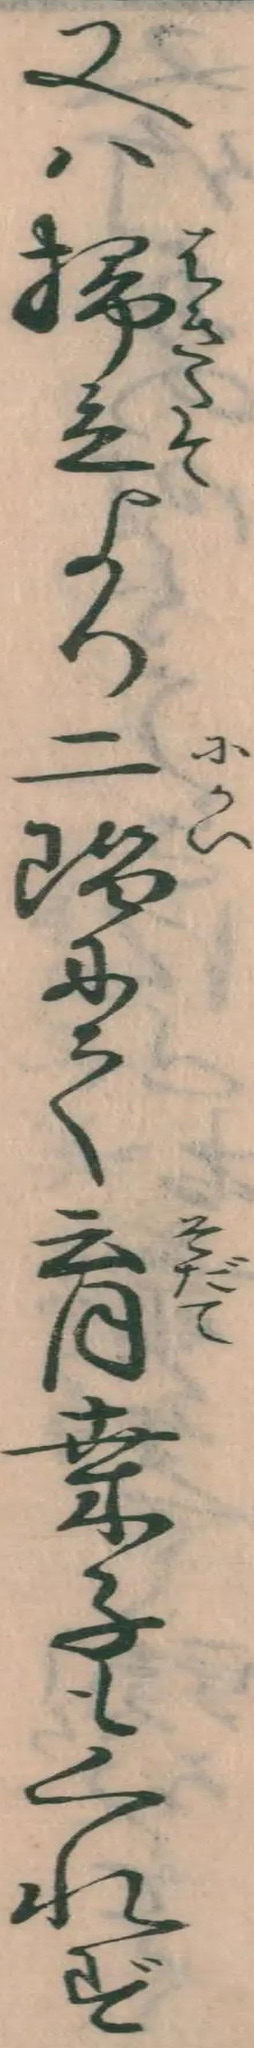又は掃立より二階にて育桑子もくれず
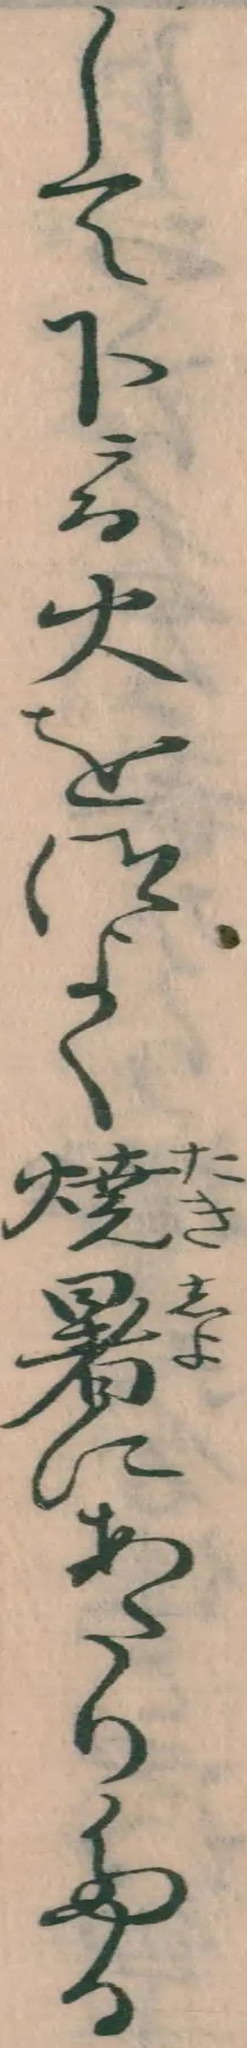して下にて火をつよく焼暑にあたりたる
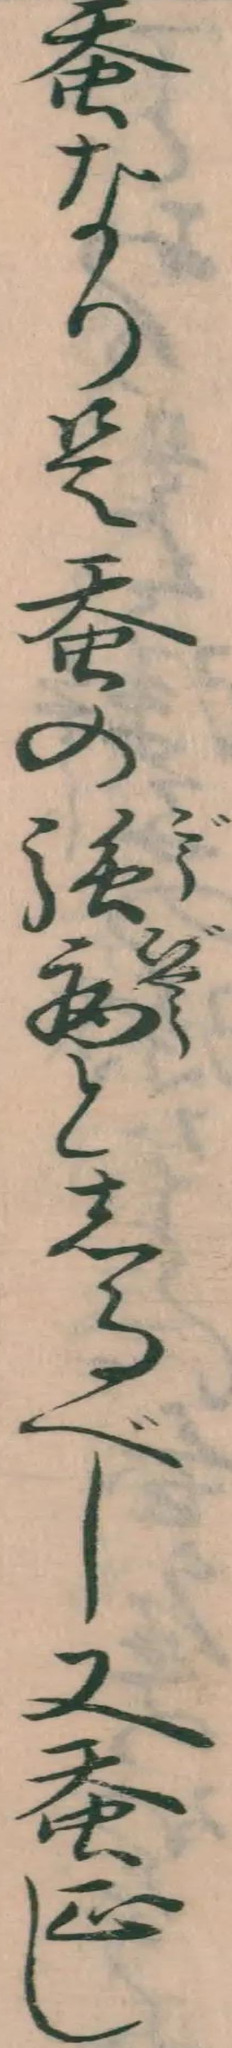蚕なり是蚕の強病としるべし又蚕正し
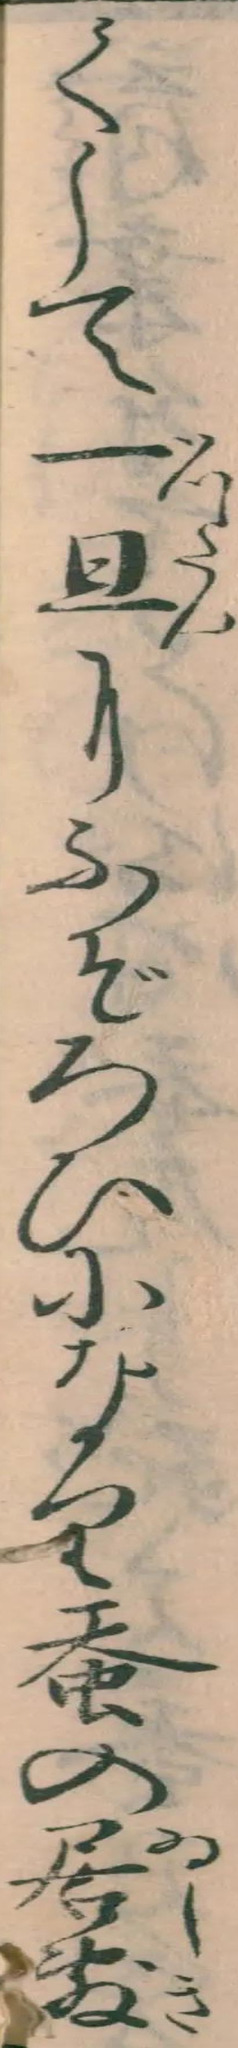くして一旦にふぞろひになり蚕の居敷
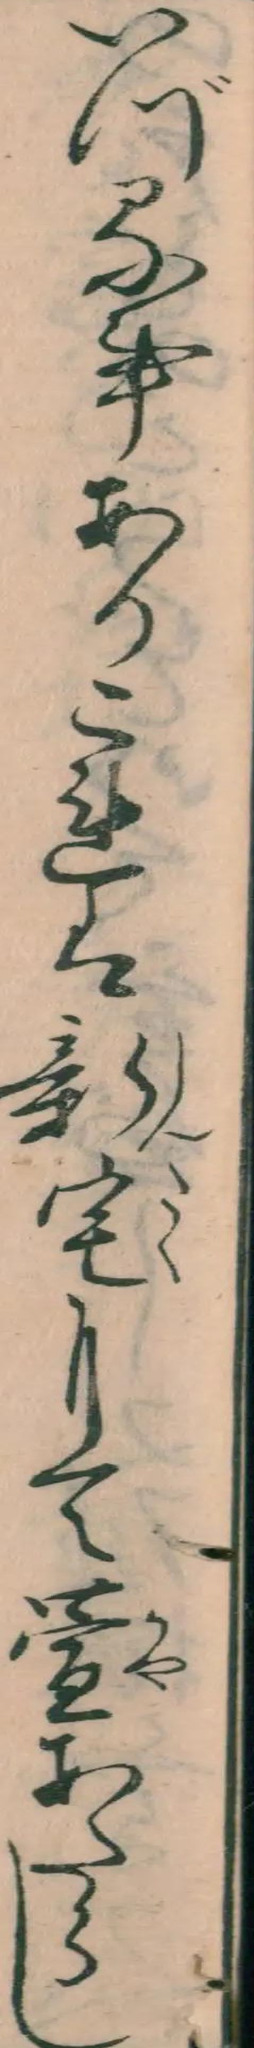いづる事ありこれは新宅にて萱あたらし
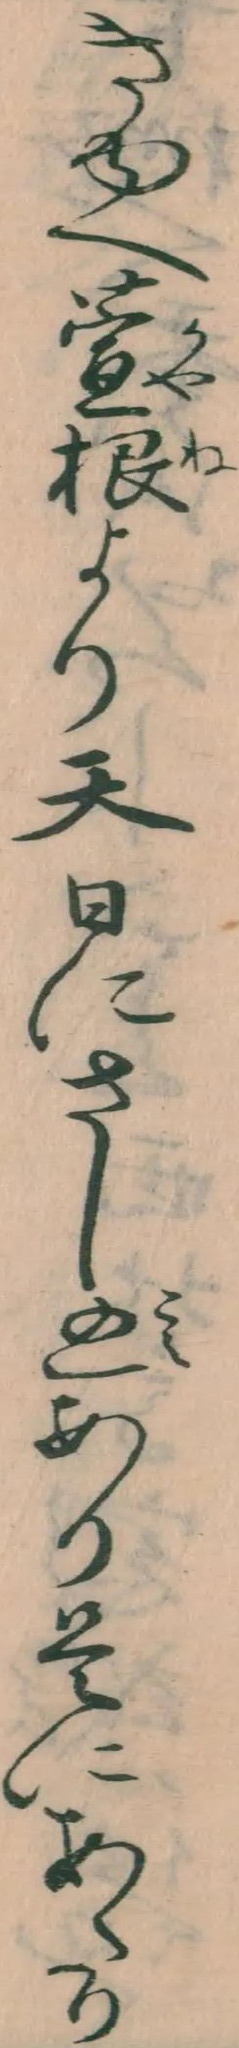きゆへ萱根より天日にさし込あり是にあたり
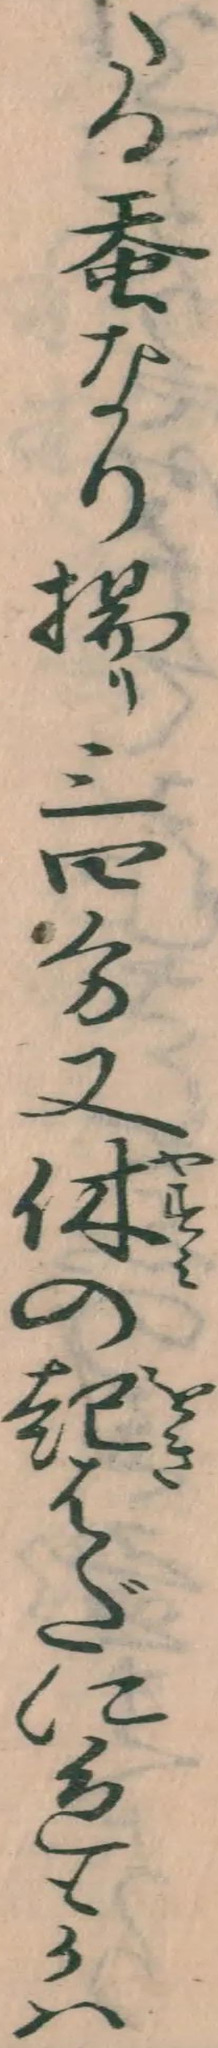たる蚕なり揚り三四分また休の起はだに色もかは
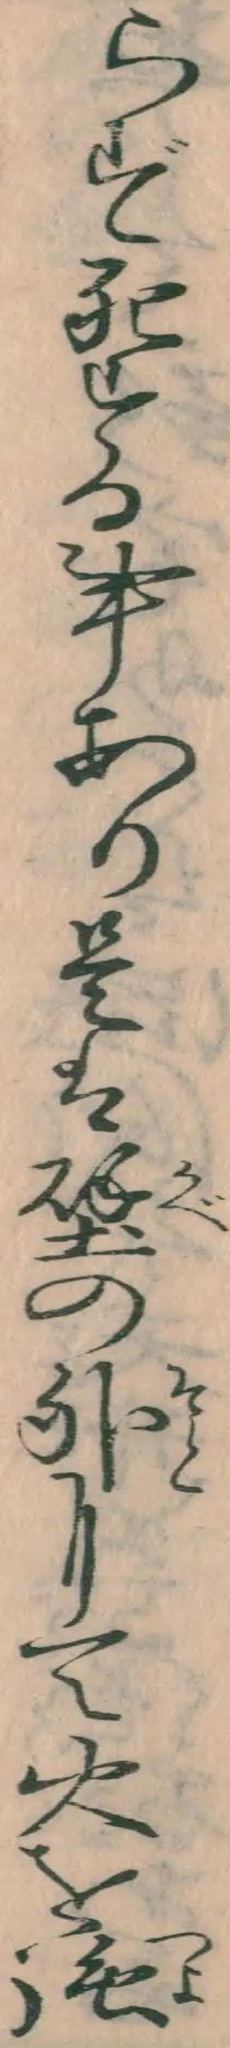らず死する事あり是は壁の外にて火を強
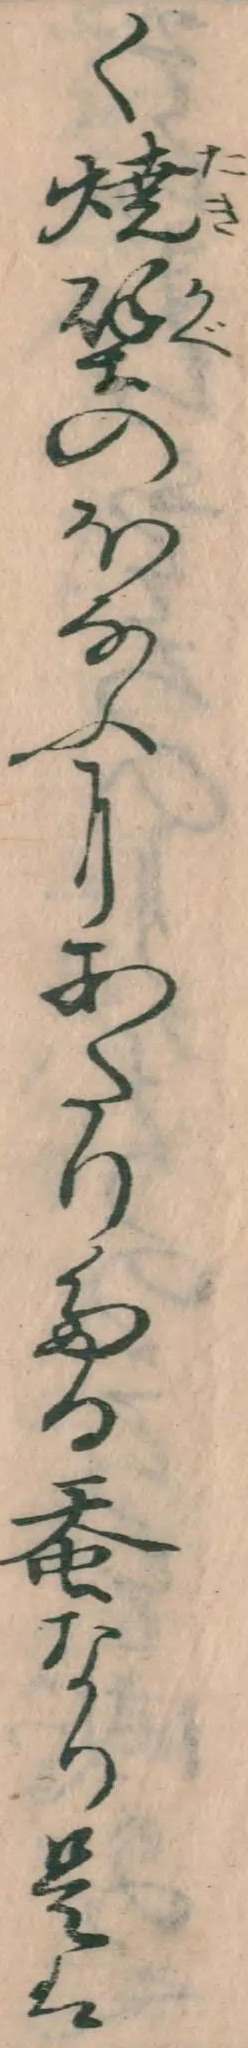く焼壁のほなふにあたりたる蚕なり是は
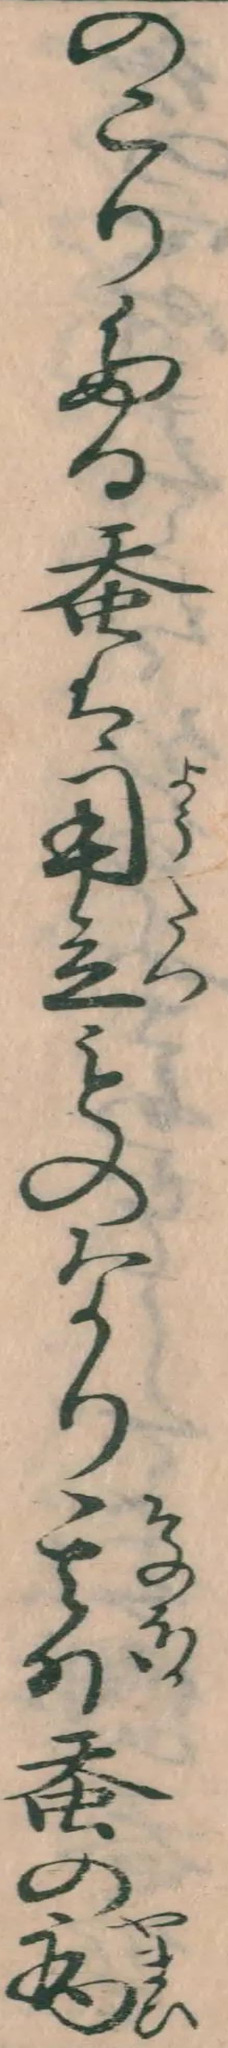のこりたる蚕は用立ものなり其外蚕の病
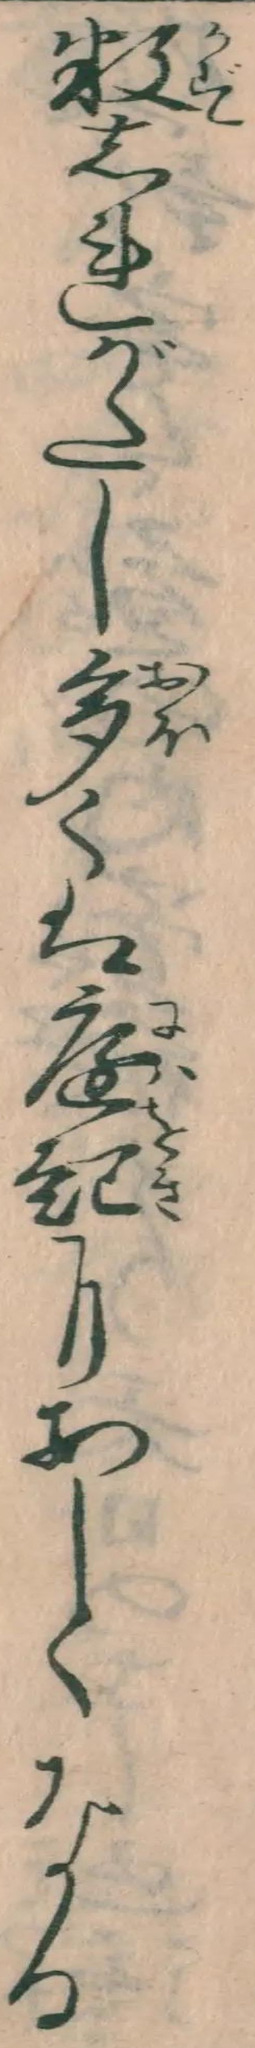数しれがたし多くは庭起にあしくなる
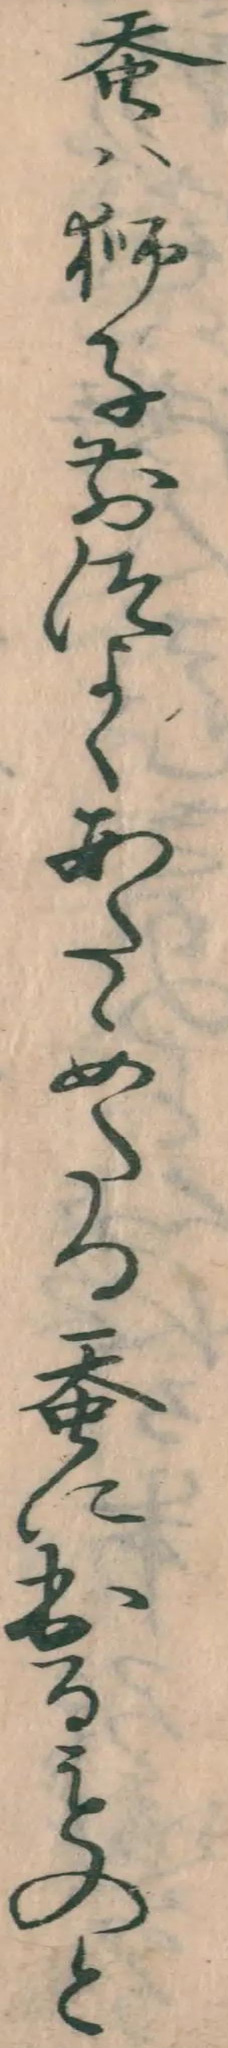蚕は獅子前つよくあたゝめたる蚕に出るものと
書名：新撰養蚕秘書
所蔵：国立国会図書館 National Diet Library, JAPAN
